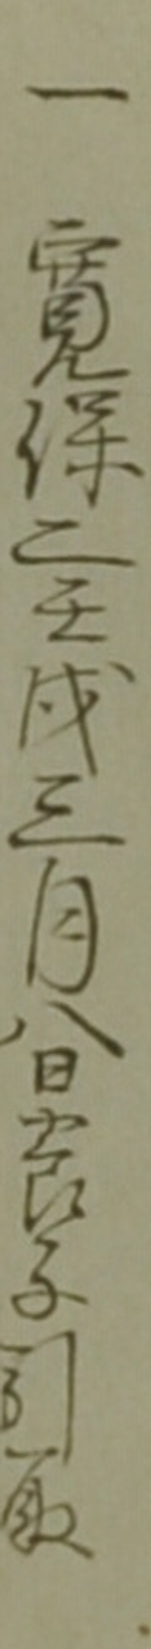一寛保二壬戌三月八日養子引取
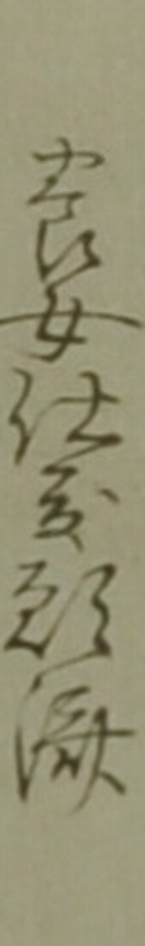養女仕度願済
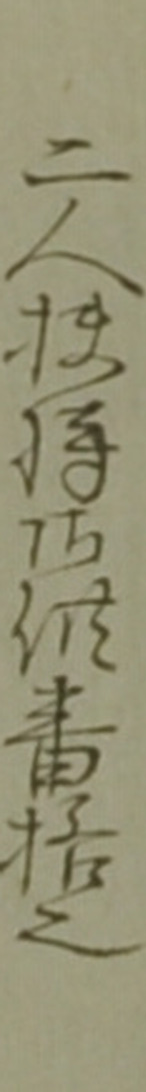二人扶持御供番格也
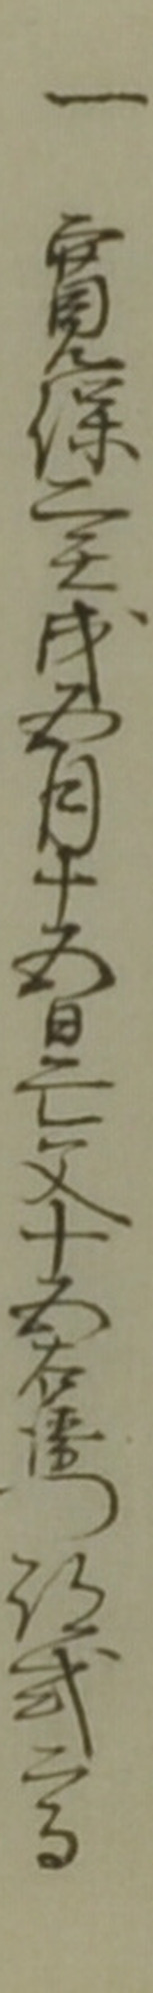一寛保二壬戌五月十五日亡父十五右衛門跡式高
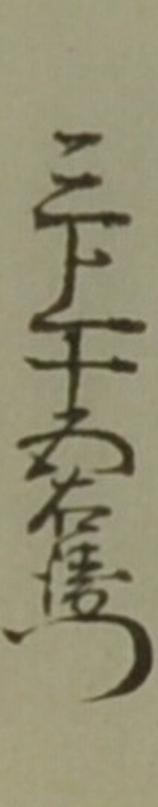三上十五右衛門
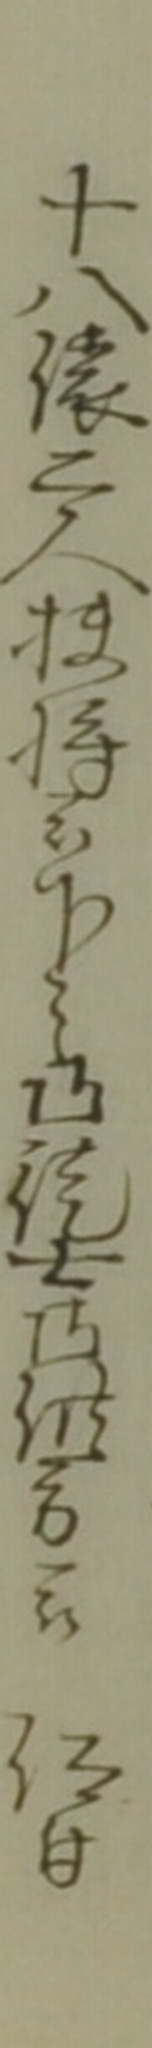十八俵二人扶持被下之御徒士御供方被仰付
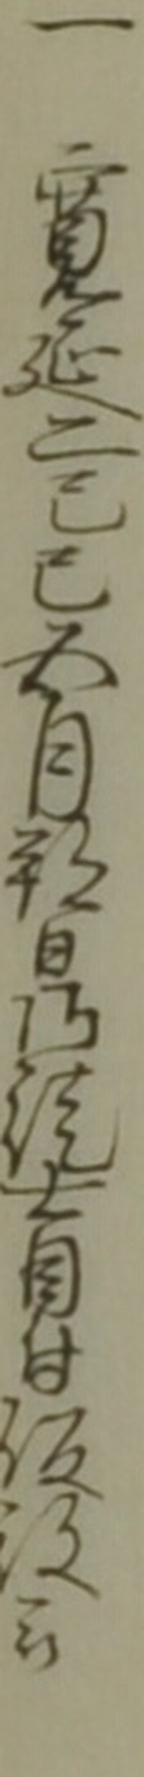一寛延二己巳五月朔日御徒士目付仮役被
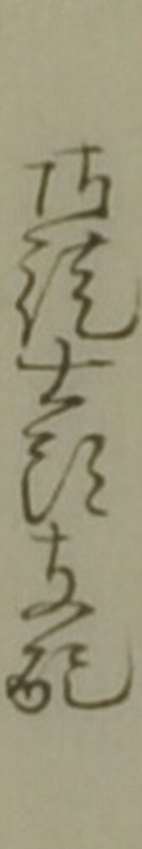御徒士頭支配
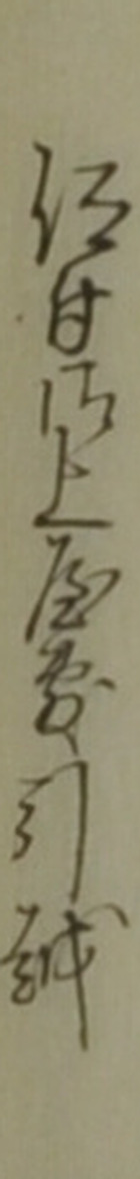仰付御上屋敷引越
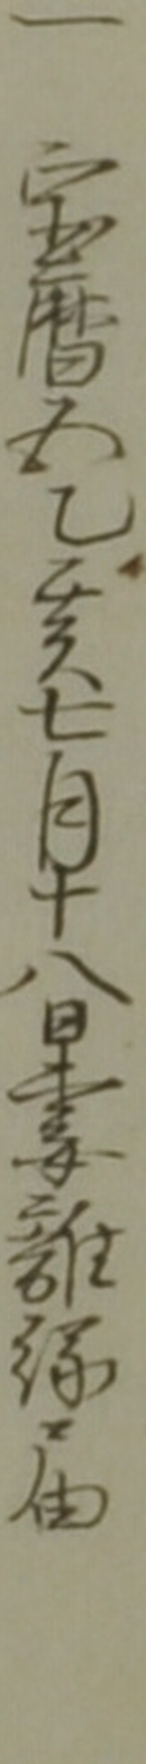一宝暦五乙亥七月十八日妻離縁届
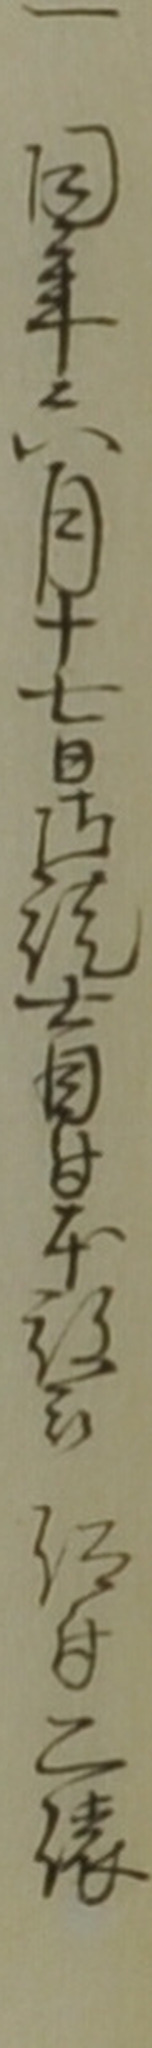一同年六月十七日御徒士目付本役被仰付二俵
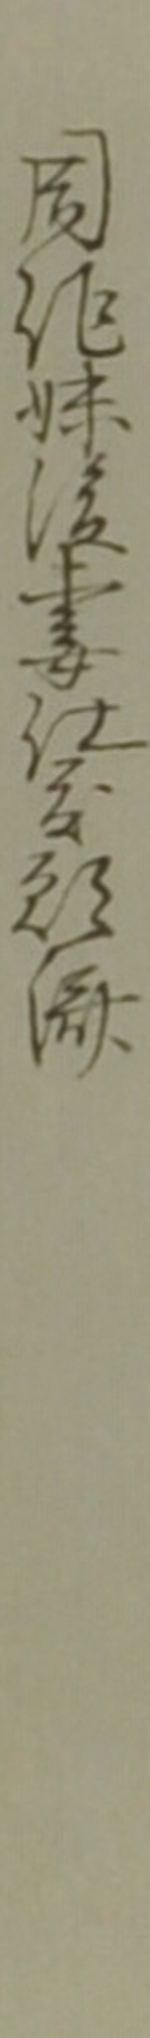周作妹後妻仕度願済
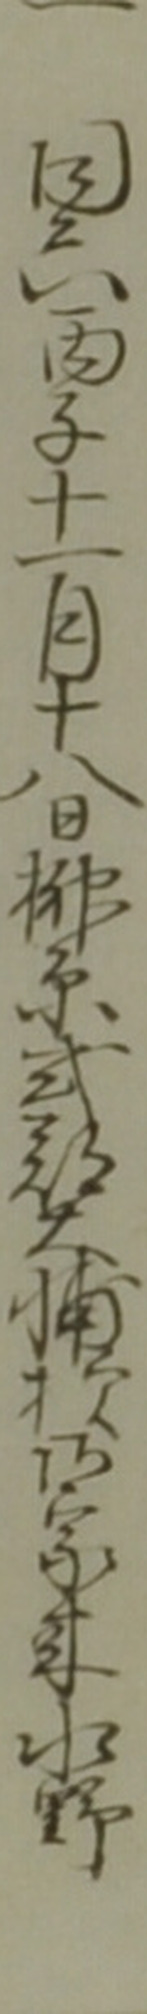一同六丙子十一月十八日榊原式部大輔様御家来水野
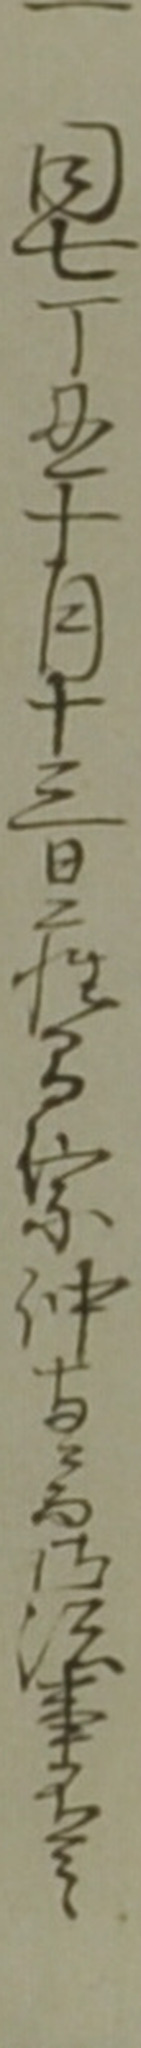一同七丁丑十月十三日座間宗仲寺ニ而御法事有之
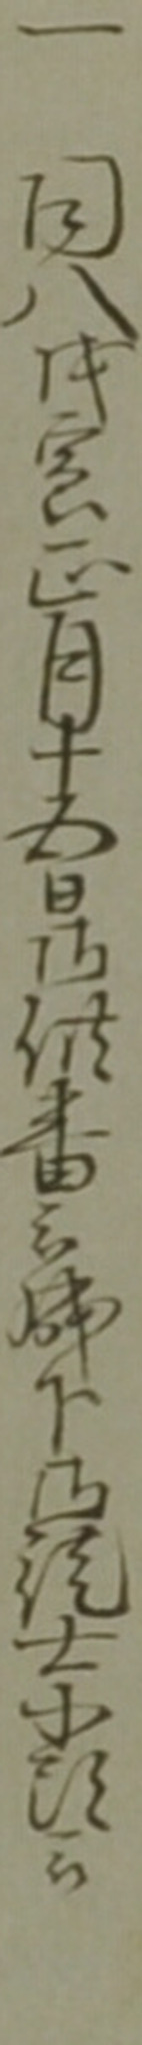一同八戊寅正月十五日御供番被成下御徒士小頭被
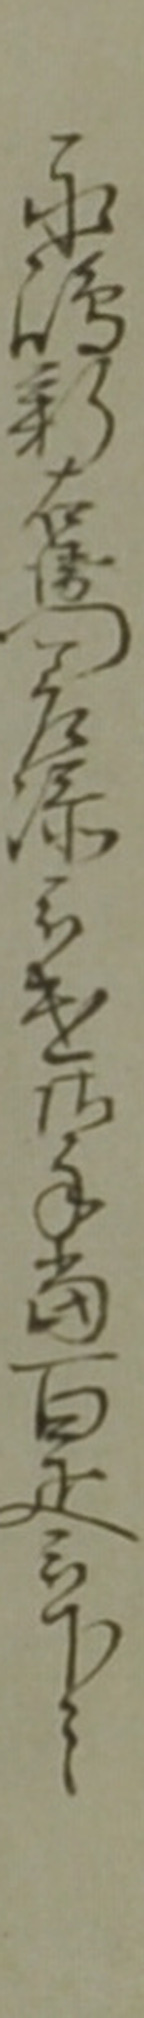永嶋新右衛門差添被遣御手当百疋被下之
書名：無足廃家（弐）
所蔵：伊那市立高遠町図書館・合同会社AMANE
